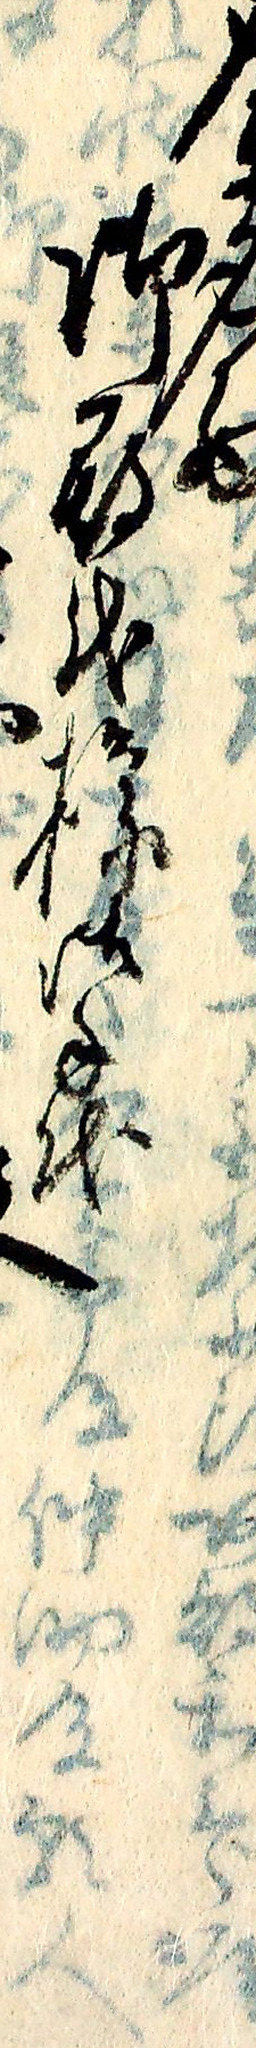御郡代様御手代
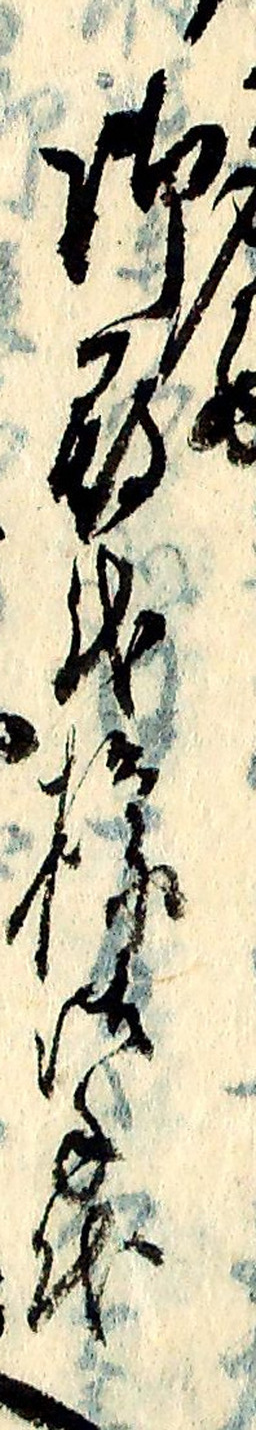御郡代様御手代
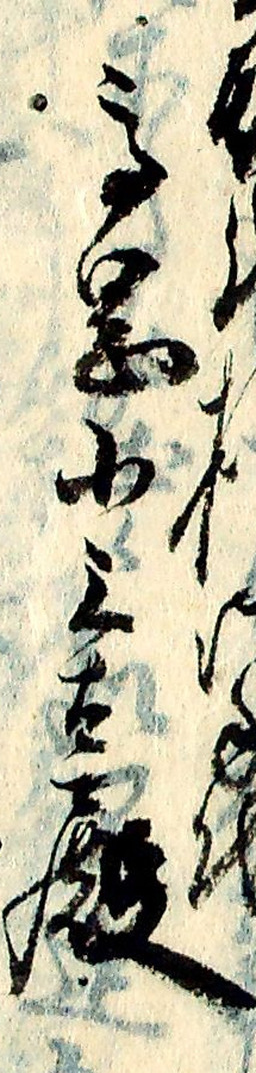高岡小三太殿
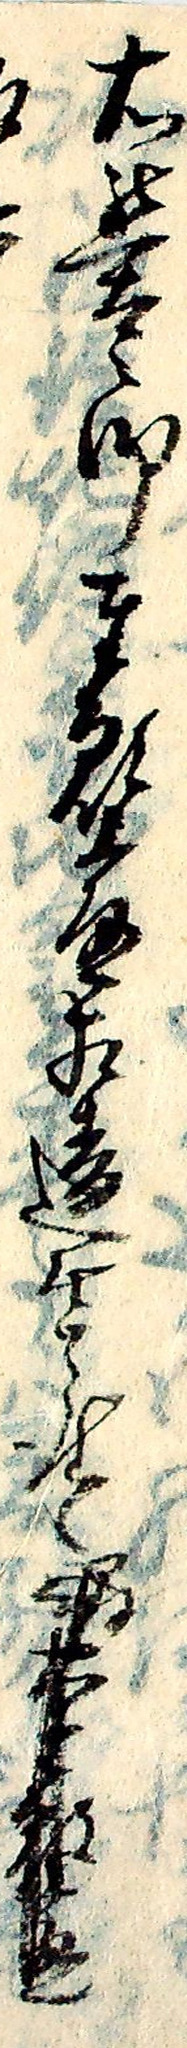右熊太郎奉願上通相違無御座候間
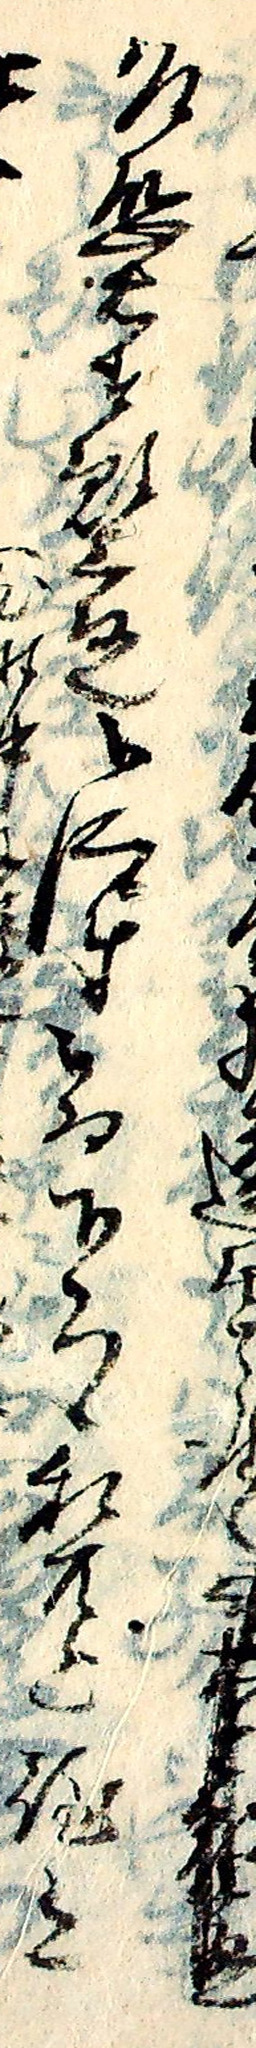乍恐右奉願上通被仰付被為下候はゝ私共迄難有
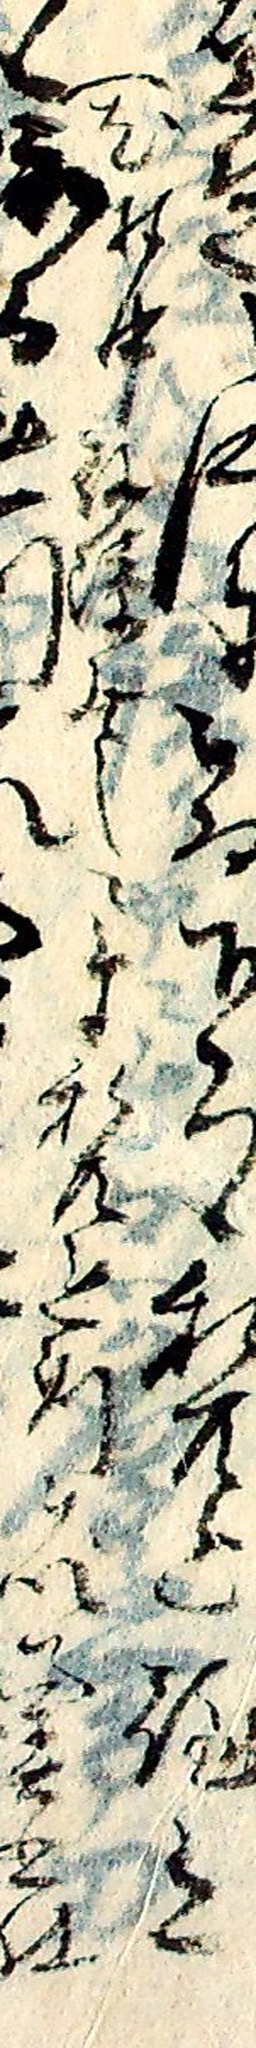尤村中故障無之に付私共連判を以奥書仕
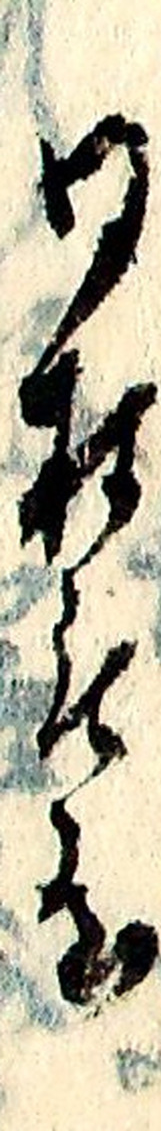同村庄屋
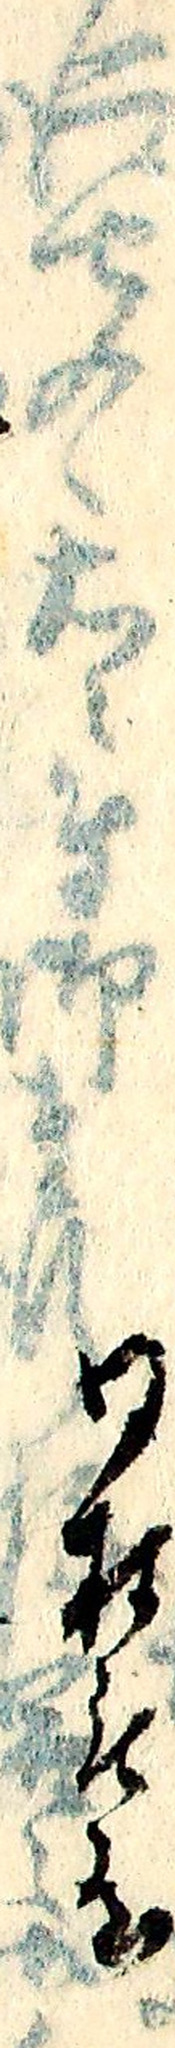同村庄屋
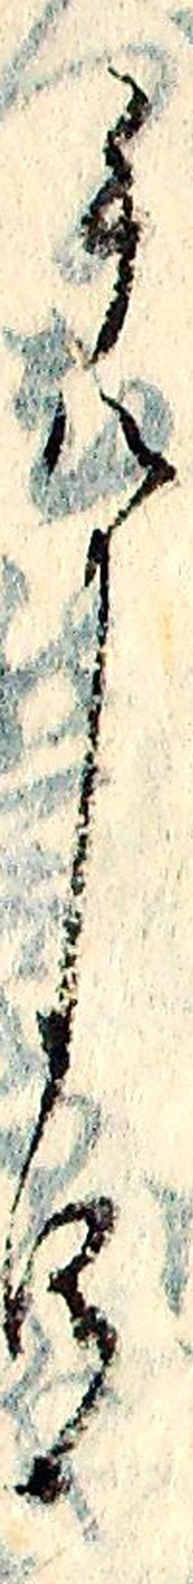午八月四日
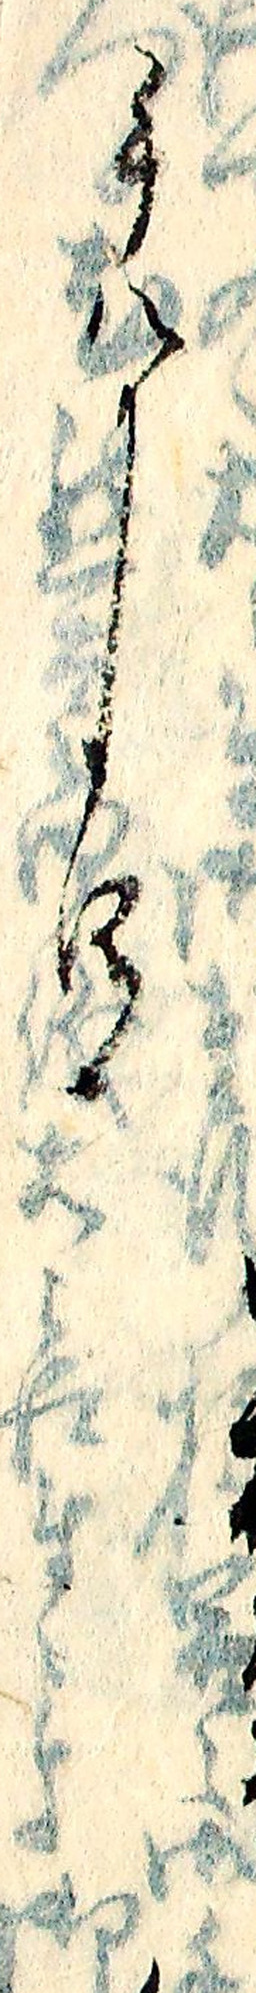午八月四日

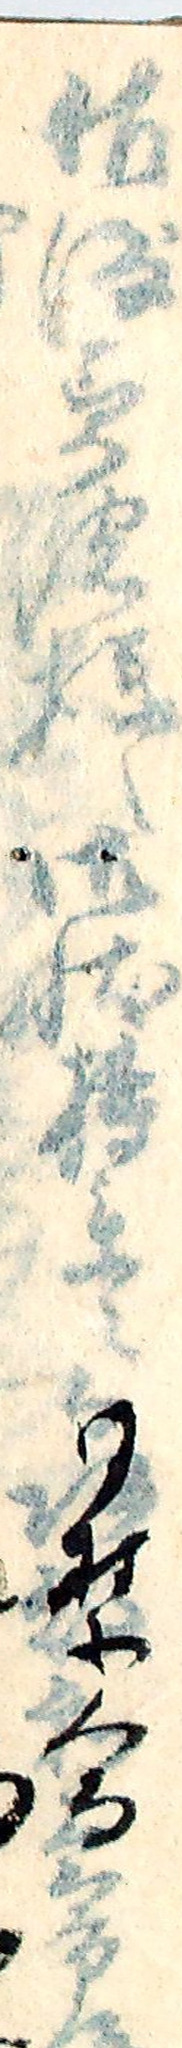同村五人与
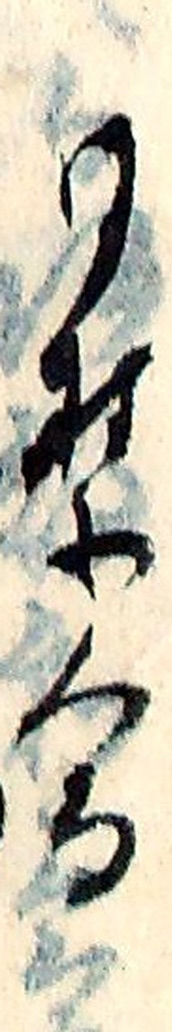同村五人与
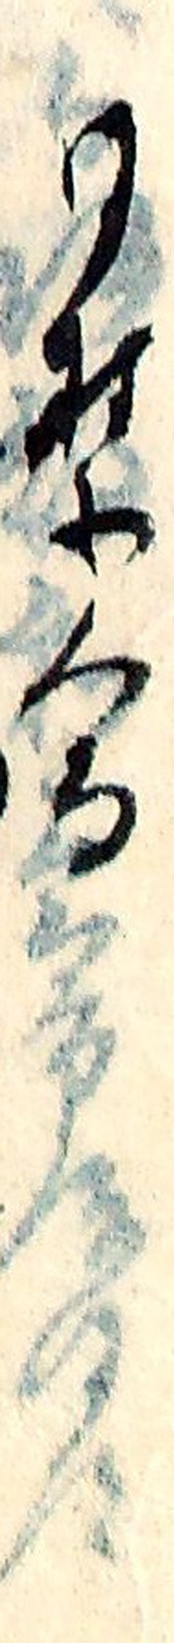同村五人与
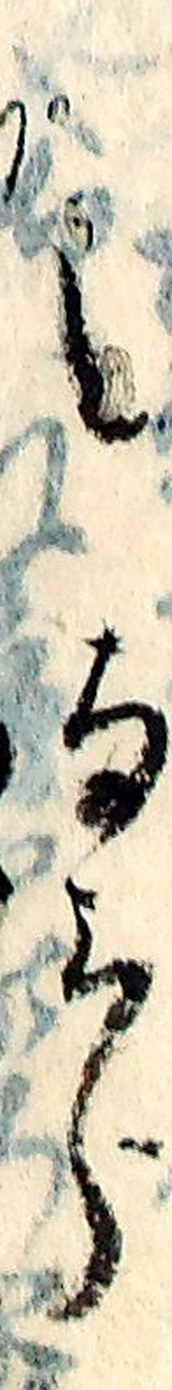与三郎
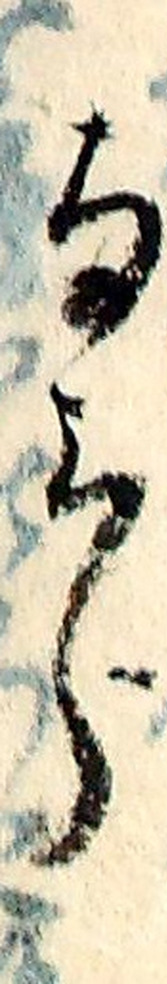与三郎
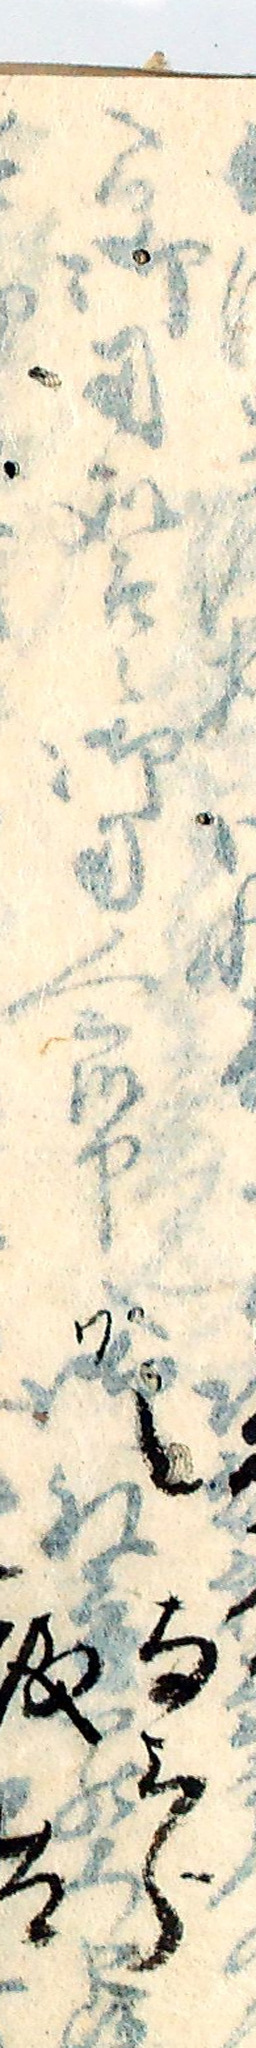与三郎
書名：諸御願書控(後藤氏壱番）
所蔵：鳴門教育大学 Naruto University of Education
